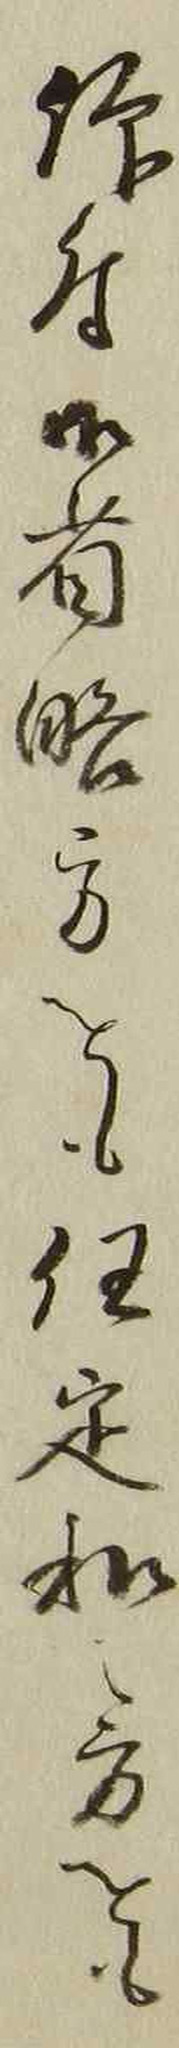仰付御省略方をも任定和之方をも
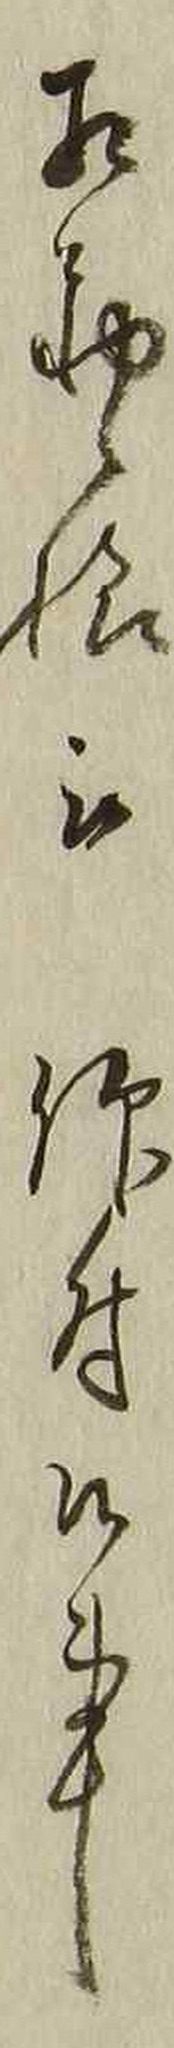相勤候様被仰付候事
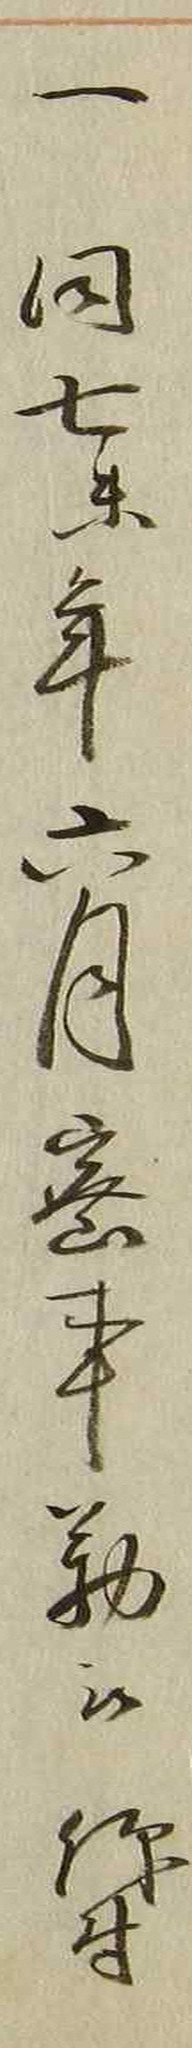一同七未年六月密事勤被仰付
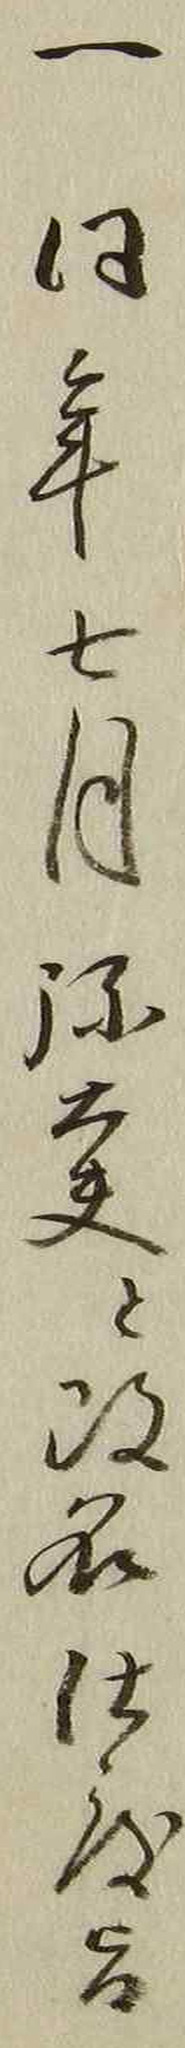一同年七月弥太夫と改名仕度旨
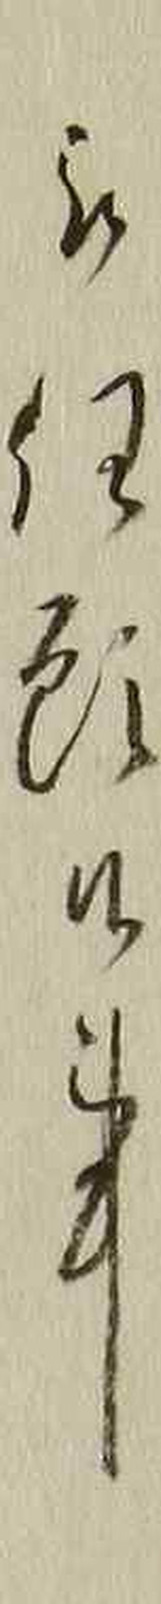被任願候事
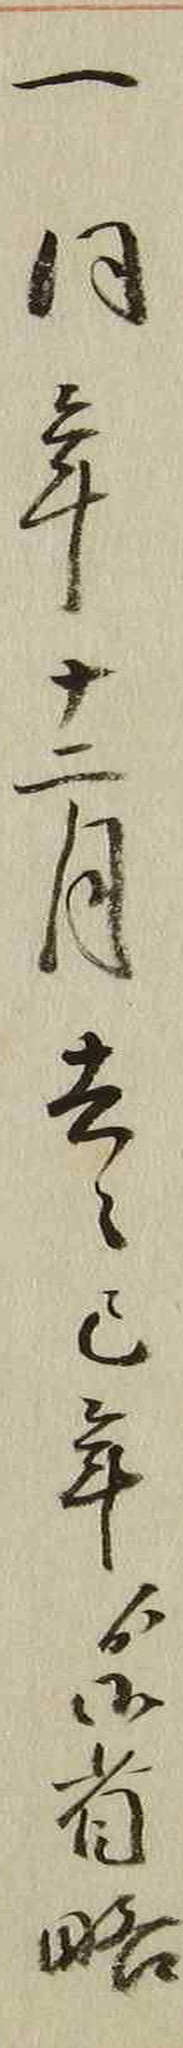一同年十二月去々巳年ゟ御省略
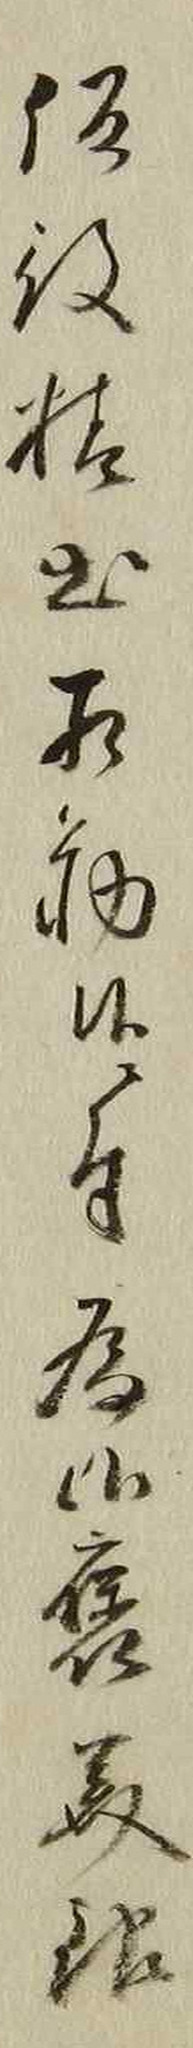仮役精出相勤候ニ付為御褒美銀
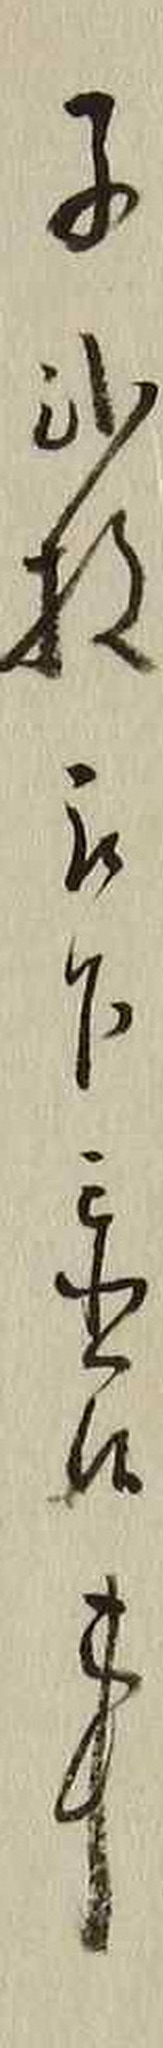子弐枚被下置候事
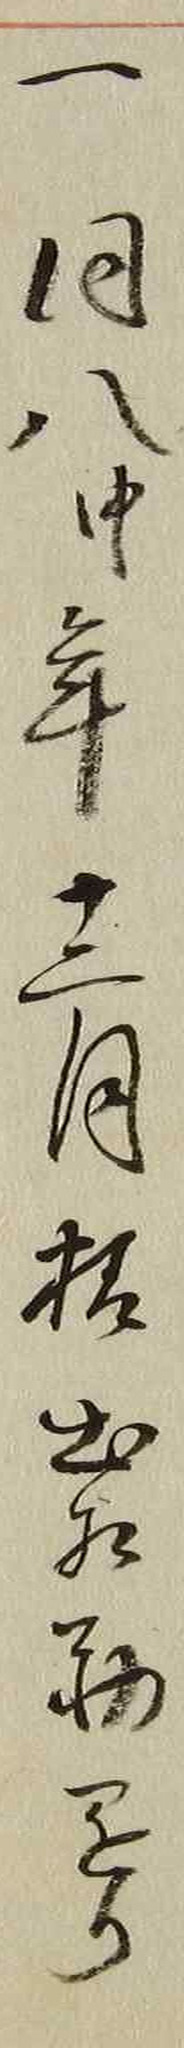一同八申年十二月精出相勤懸り
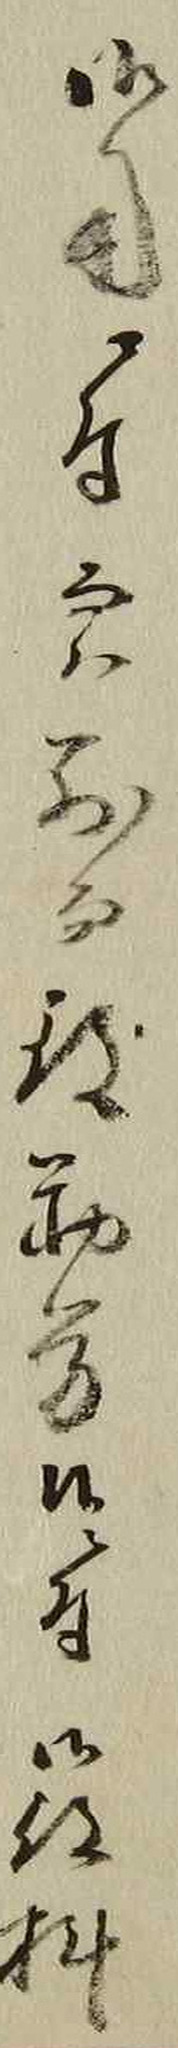御用ニ付而ハ別而致勤労候ニ付御役料
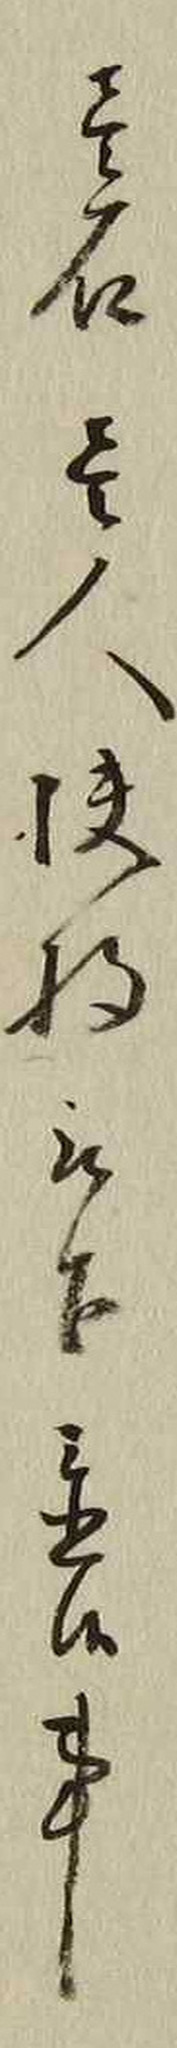壱石壱人扶持被下置候事
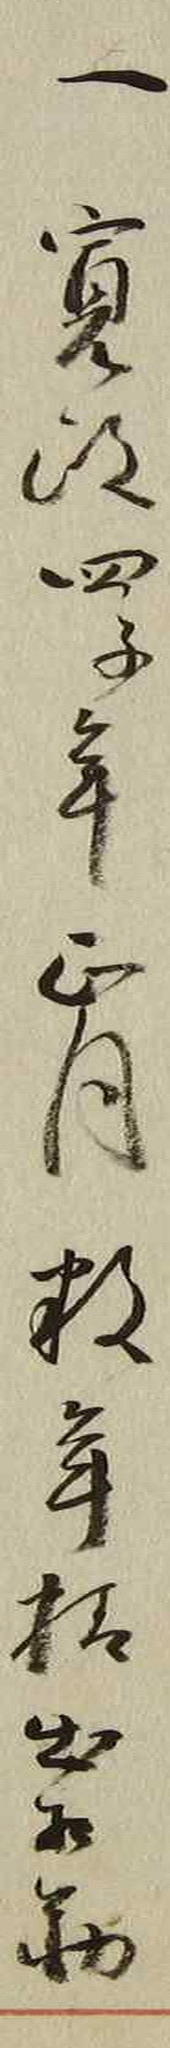一寛政四子年正月数年精出相勤
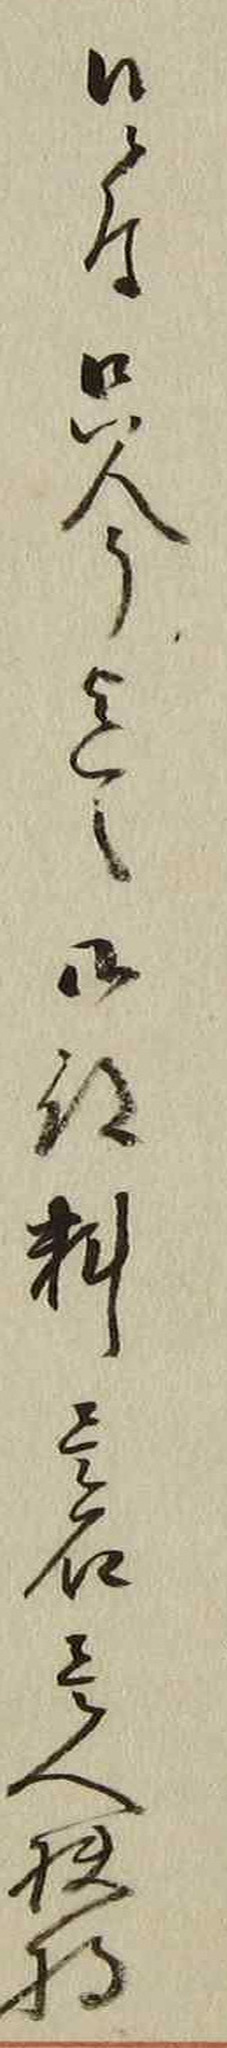候ニ付只今迄之御役料壱石壱人扶持
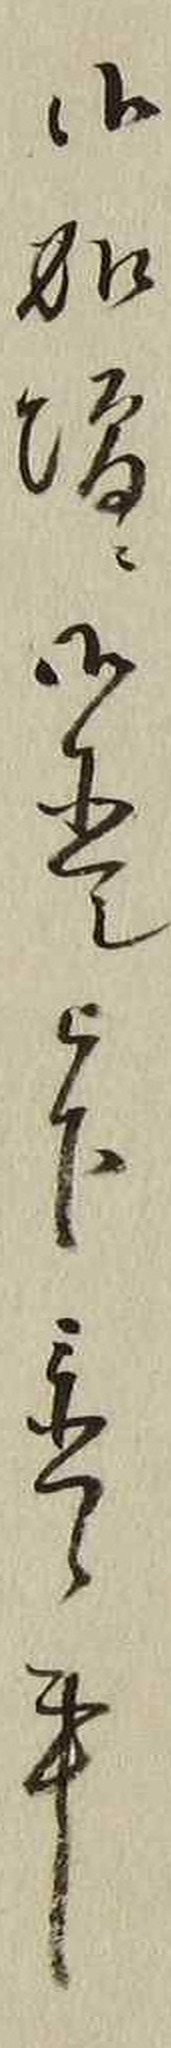御加増ニ御直し被下置候事
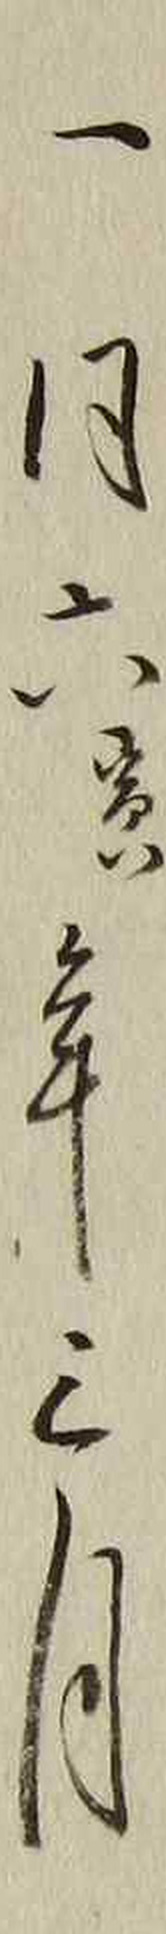一同六寅年三月
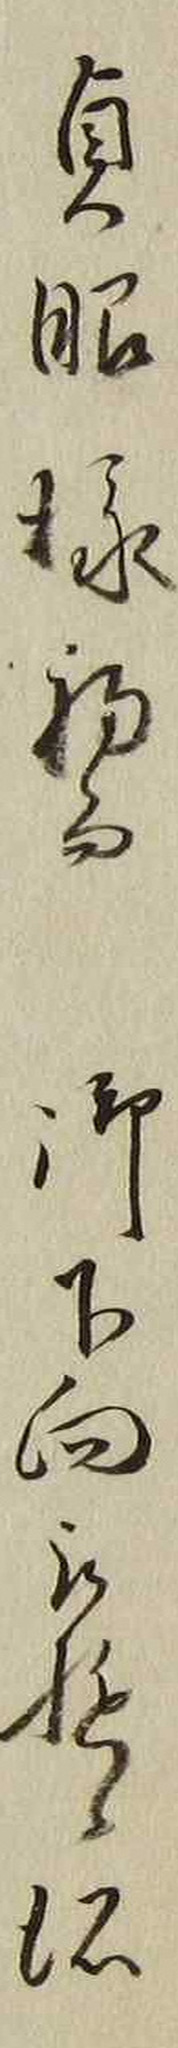貞昭様初而御下向被遊候跡
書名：諸士系譜　巻之32　い之部32
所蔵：会津若松市立会津図書館
